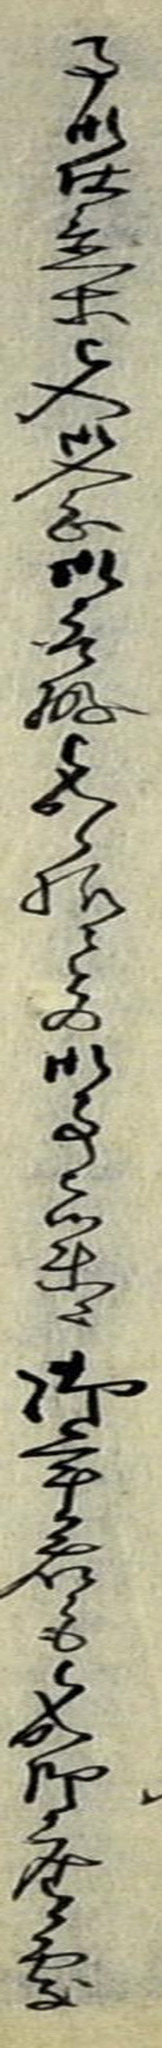事御仕置等被入御入念御取扱被成候様にとの御事に候未た御年若にも被成御座候処
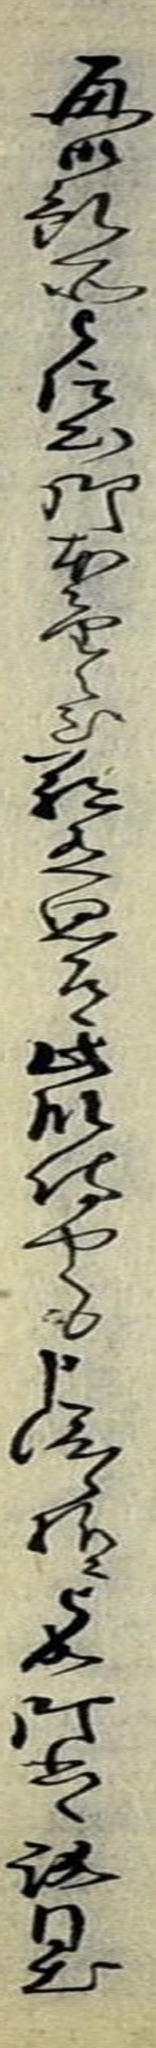再御預所被仰出御本望之至難有思召候此段侍中へも申渡候様に被成御書候誠目出
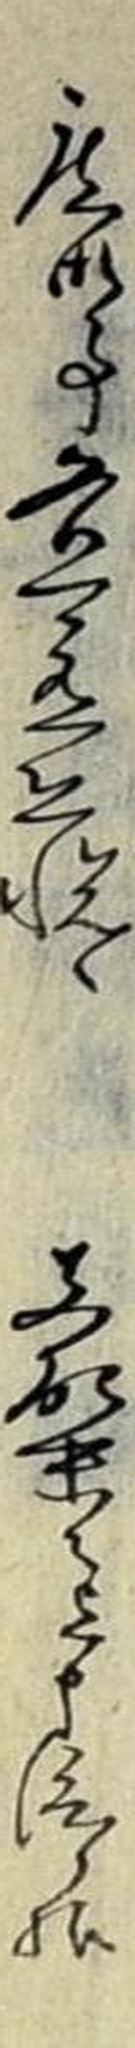度御事各可有恐悦候支配末々迄申渡候様
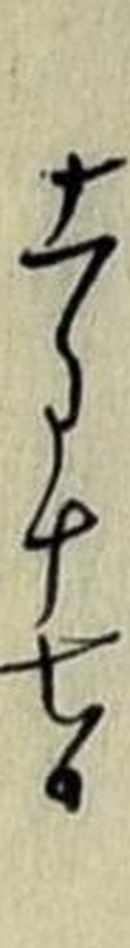十一月十七日
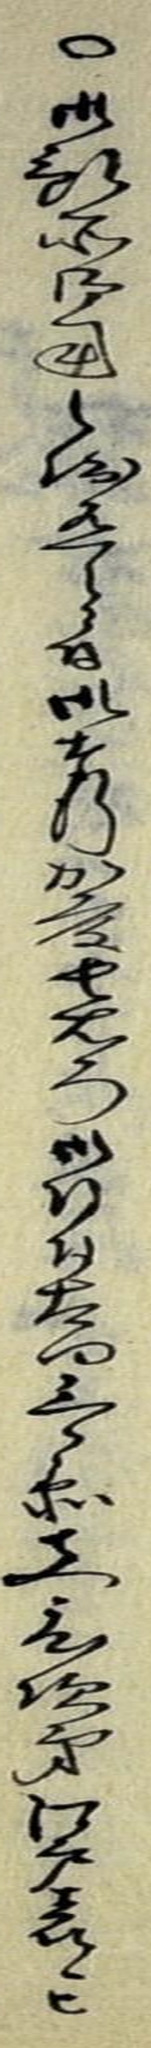〇御預所御用之儀有之に付御奉行加藤長右衛門御目付太田三郎兵衛支度次第江戸表へ被
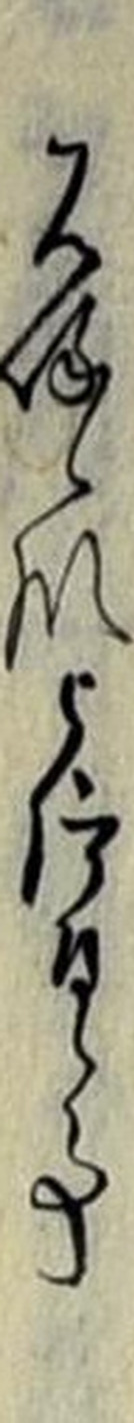召呼候段被仰付候事
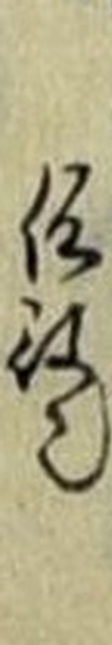仮役也
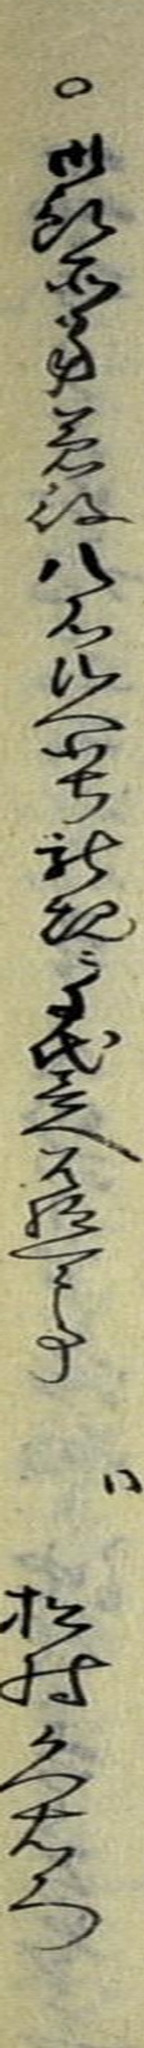〇御預所御用兼役八石弐人ふち新規に手代壱人召抱可申事松村久右衛門
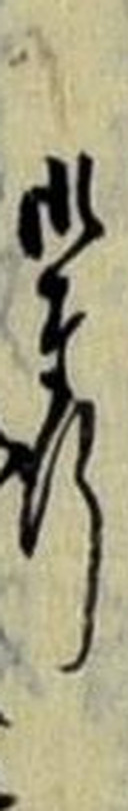御奉行
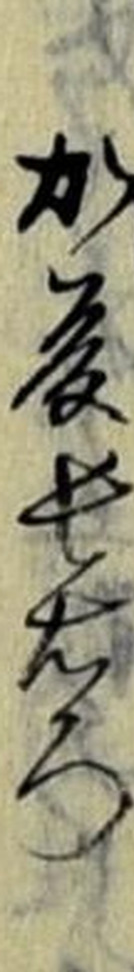加藤長右衛門
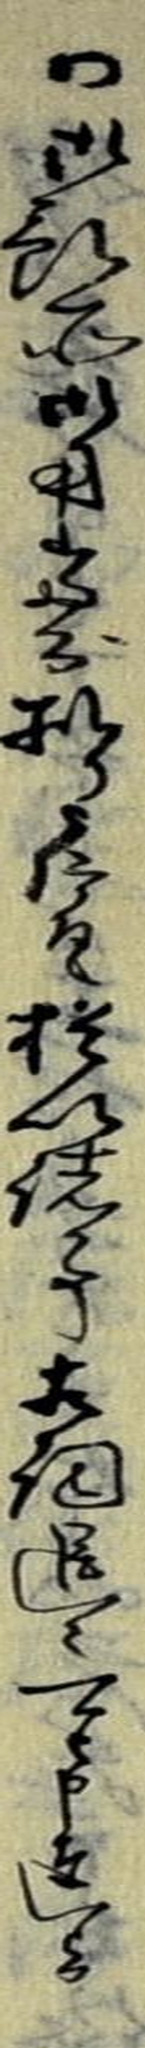〇御預所御用当分掛り被仰付候猶以諸事相伺追々可被申達旨
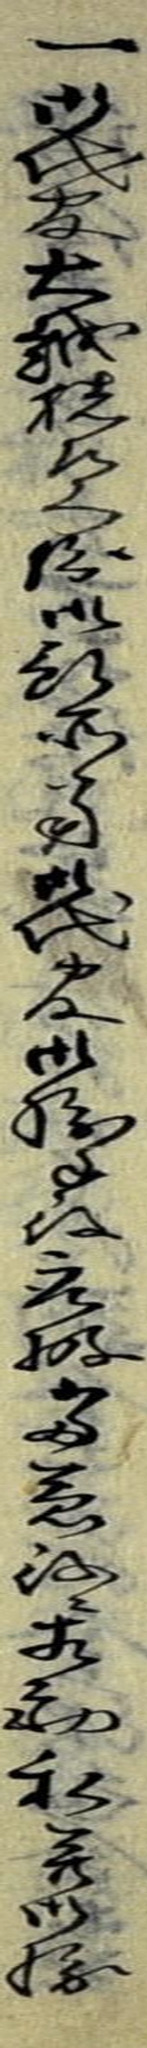一御代官大越猪左衛門儀御預所御用御代官御勝手役取扱当兼役に相勤私并御勝
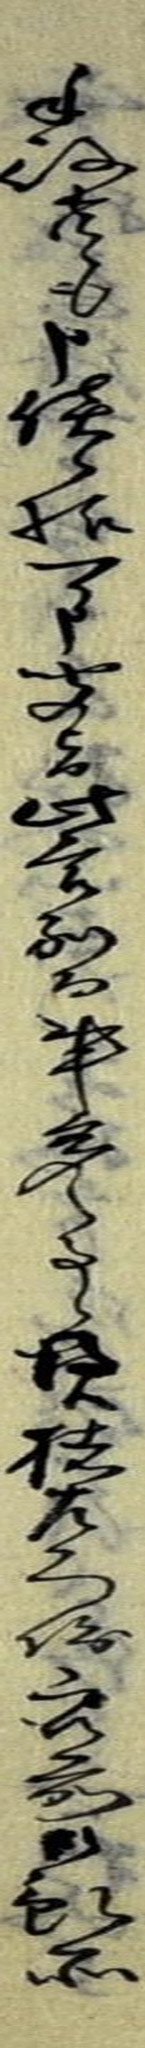手役共へ申談候様可申聞旨此節別而事多候事候得は猪左衛門儀最前御預所
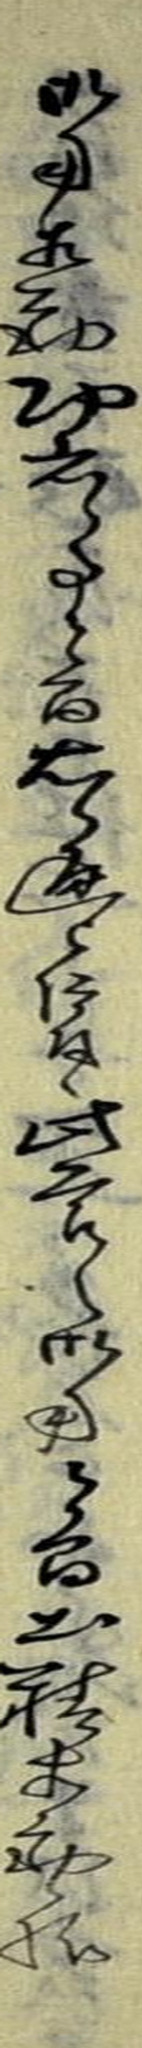御用相勤功者之事に候間右之通被仰付候此節之御用に候間出精相勤候様
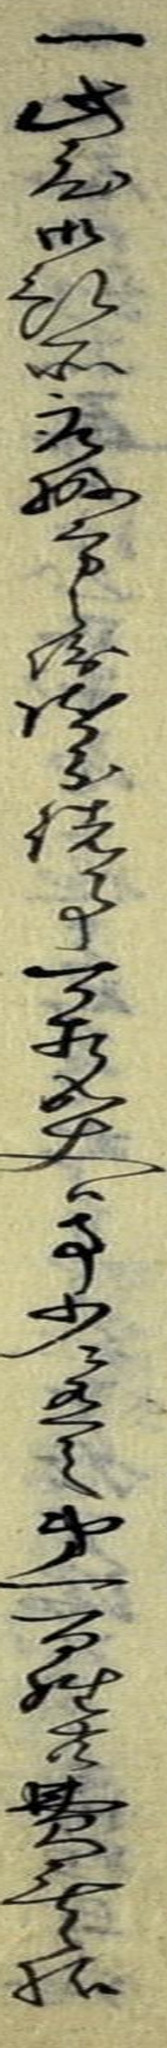一此度御預所取扱方之儀随分諸事可相成丈は事少に有之第一百姓共費無之様
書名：命令之部 二
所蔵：福井県文書館 Fukui Prefectural Archives
